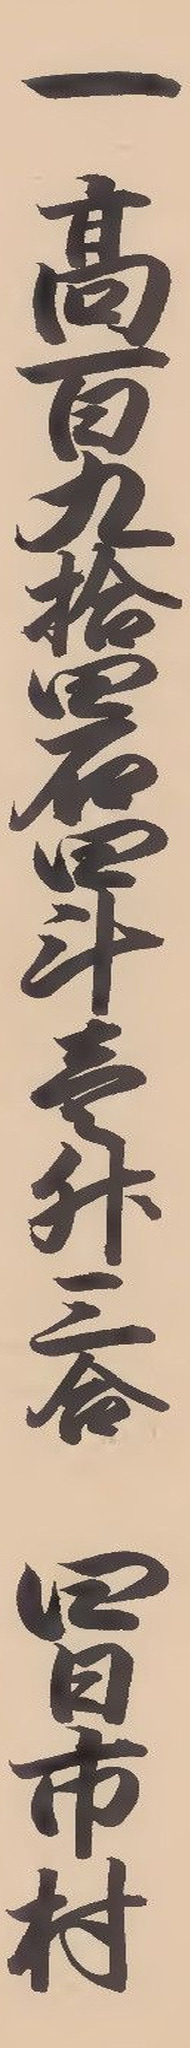一高百九拾四石四斗壱升三合四日市村
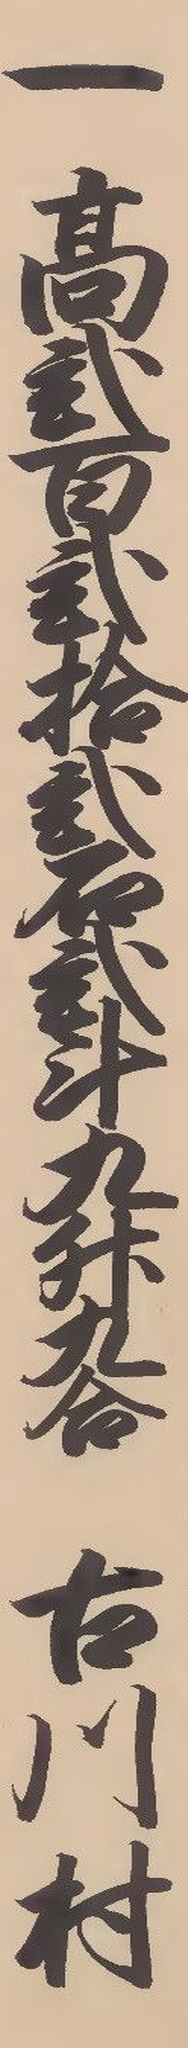一高弐百弐拾弐石六斗九升弐合嶋田村
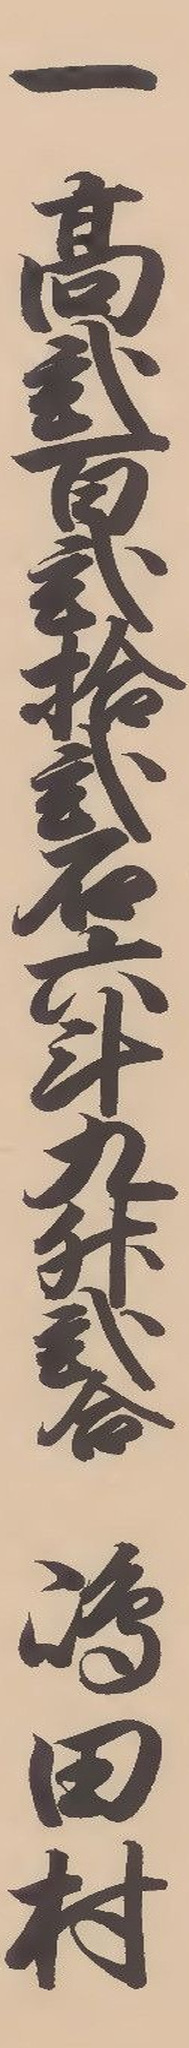一高弐百弐拾弐石六斗九升弐合嶋田村
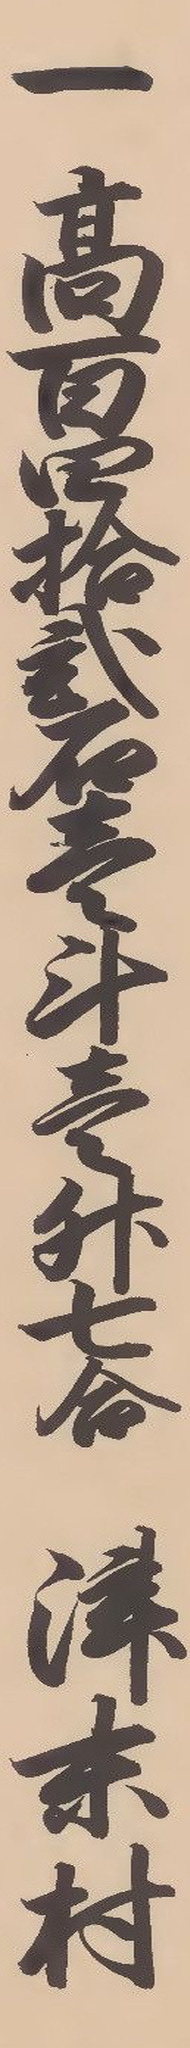一高百四拾弐石壱斗壱升七合津末村
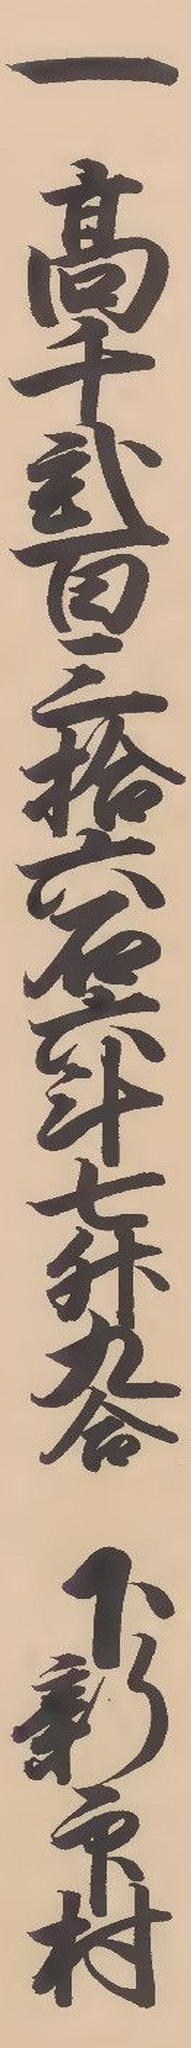一高千弐百三拾六石六斗七升九合下新印村

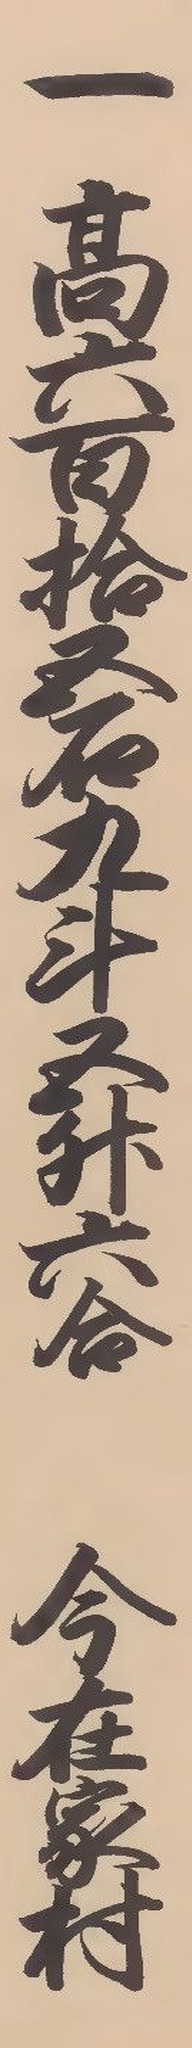一高六百拾五石九斗五升六合今在家村
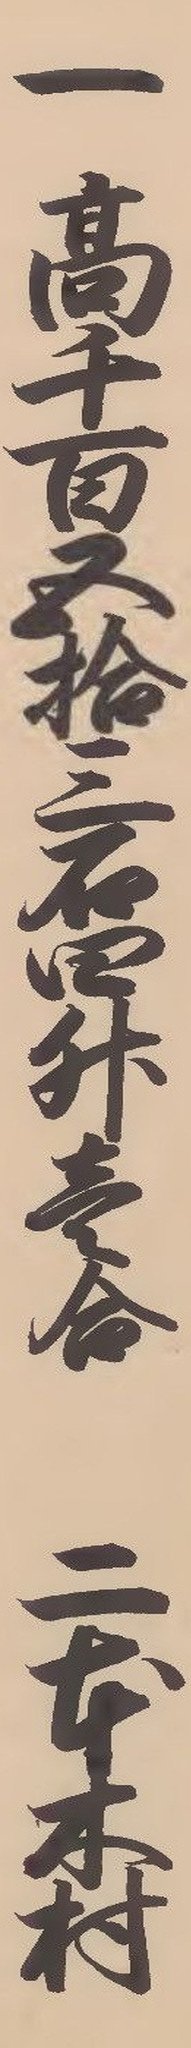一高千百五拾三石四升壱合二本木村
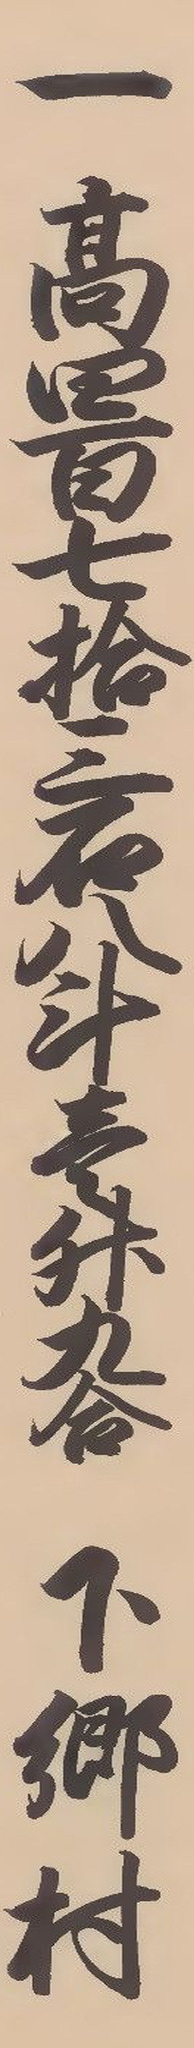一高四百七拾三石八斗壱升九合下郷村
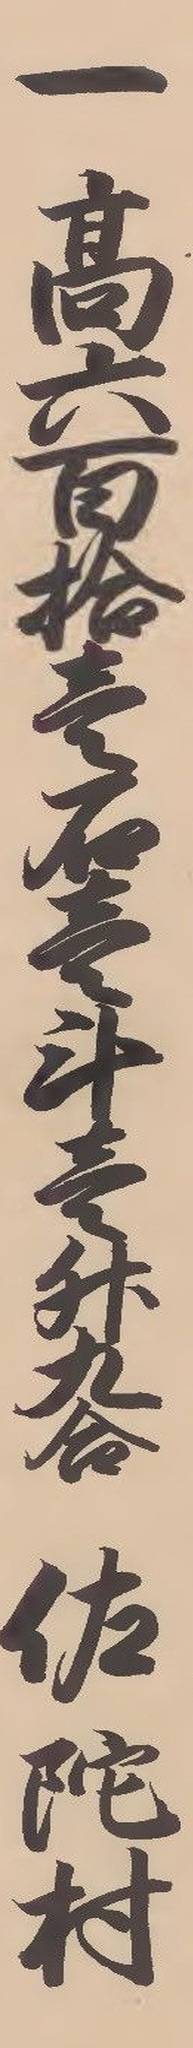一高六百拾壱石壱斗壱升九合佐陀村
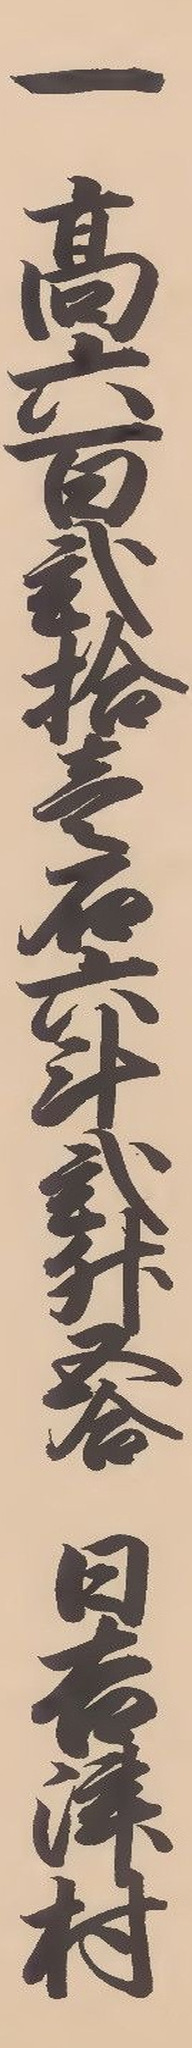一高六百弐拾壱石六斗弐升五合日吉津村
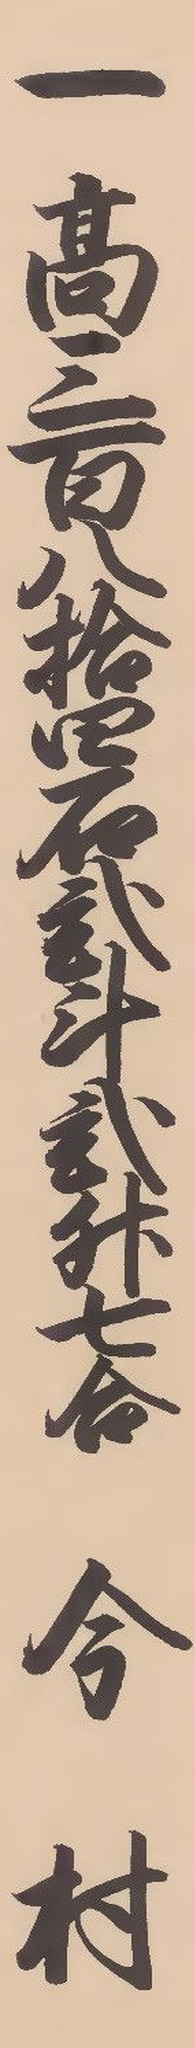一高三百八拾四石弐斗弐升七合今村
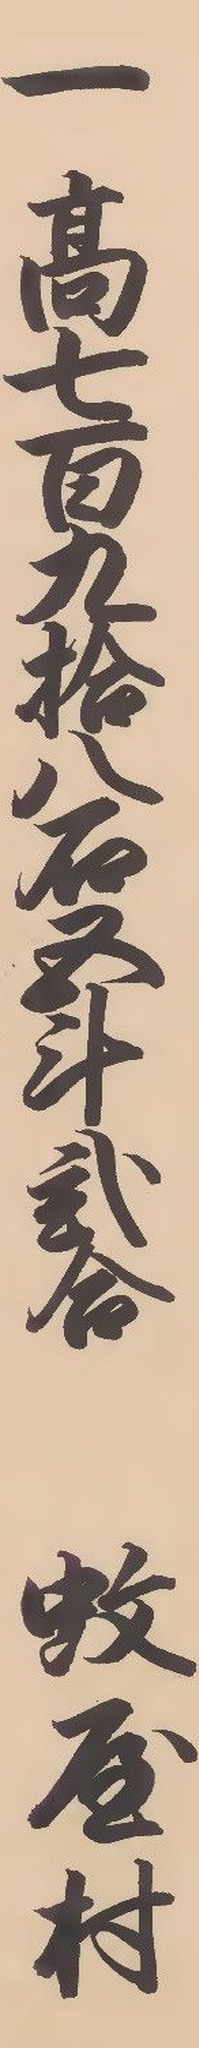一高七百九拾八石五斗弐合蚊屋村

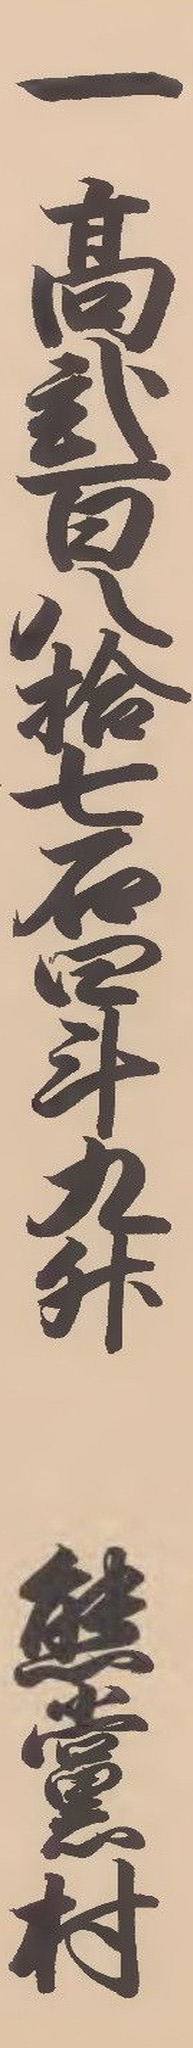一高弐百八拾七石四斗九升熊党村
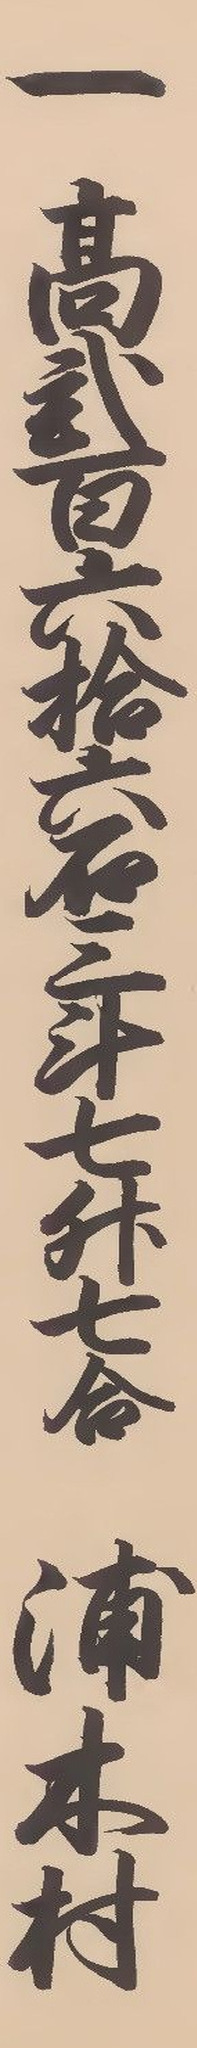一高弐百六拾六石三斗七升七合浦木村
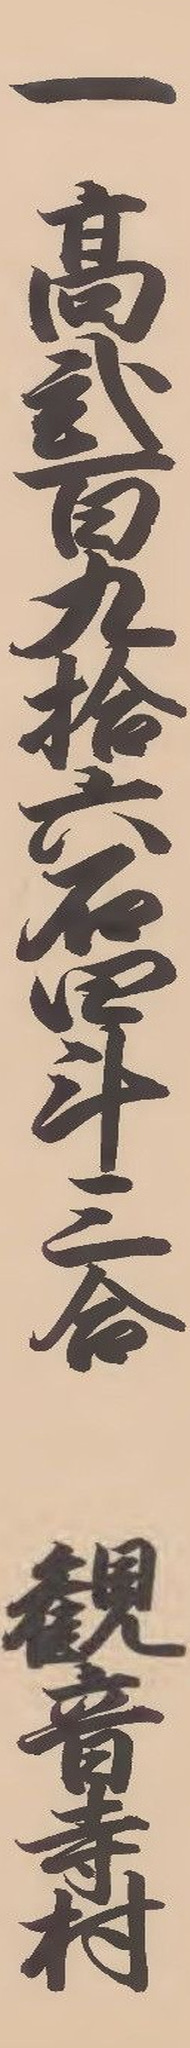一高弐百九拾六石四斗三合観音寺村
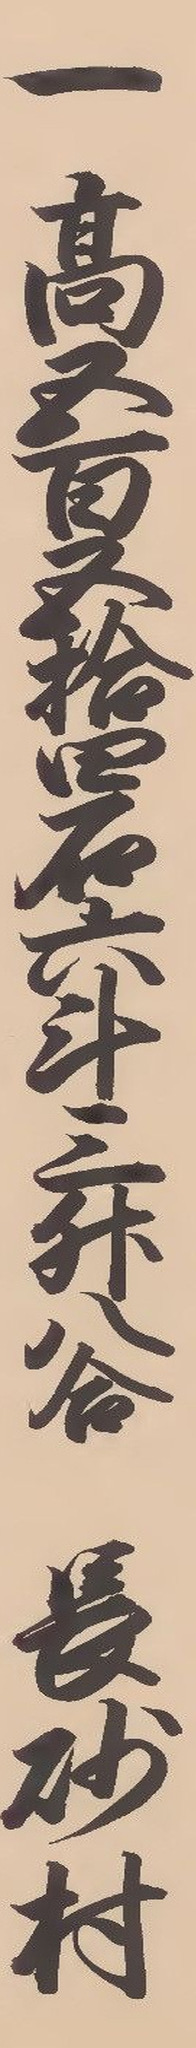一高五百五拾四石六斗三升八合長砂村
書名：伯耆国郷帳
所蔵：国立公文書館 National Archives of Japan
